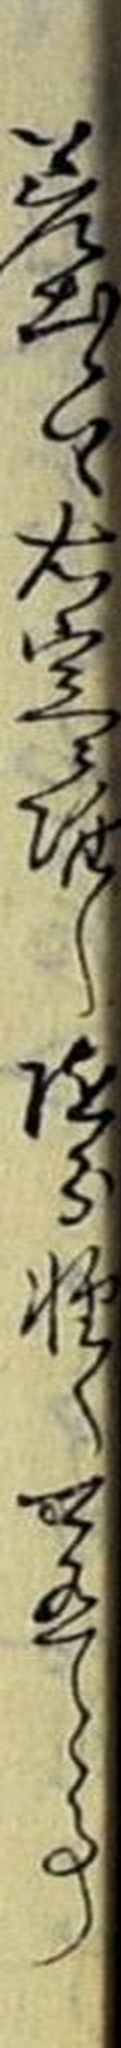差出候ハヽ右定ニ准し随分軽く可有之事
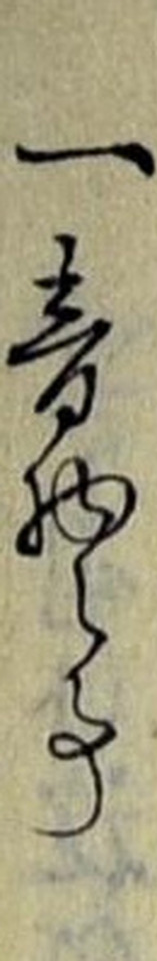一音物之事
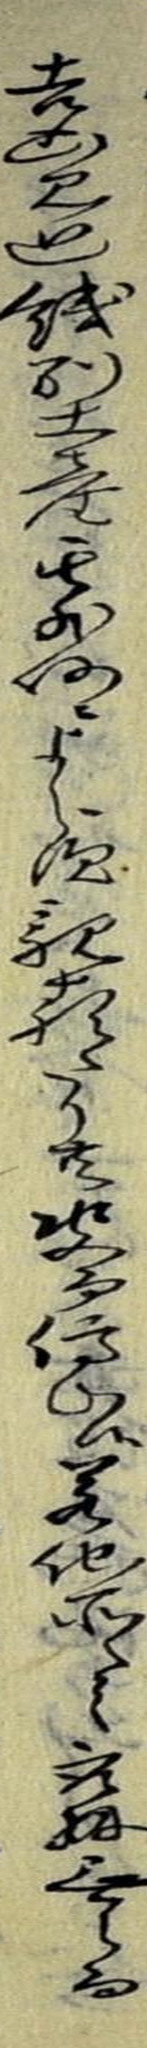吉凶見廻餞別土産其外何ニよらす親類たり共決而停止候若他所へ之取扱無之而
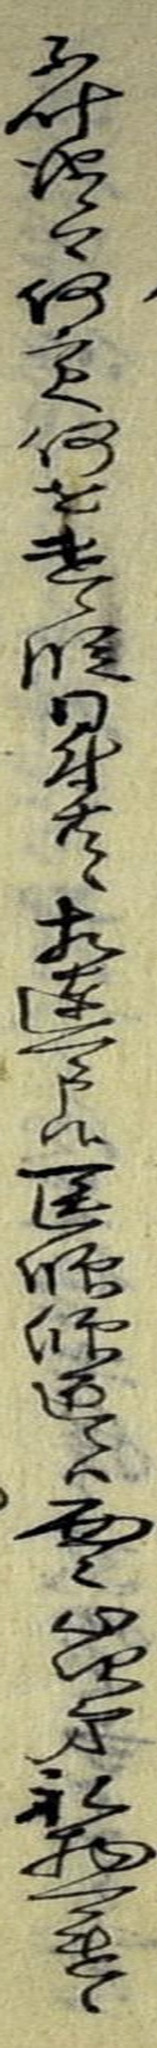不叶儀候ハヽ何方へ何を遣候段目付共へ相達可申候医師師匠ヘハ面々心次第礼物可遣候
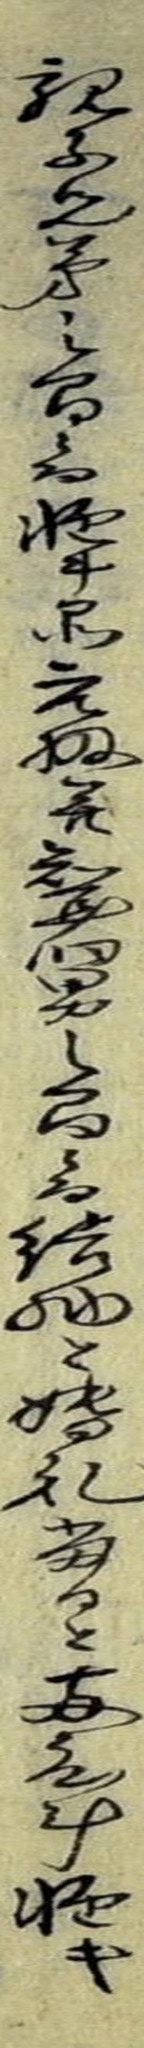親子兄弟之間ニ而軽キ品取扱并聟舅之間ニ而結納と婚礼当日と両度斗軽キ
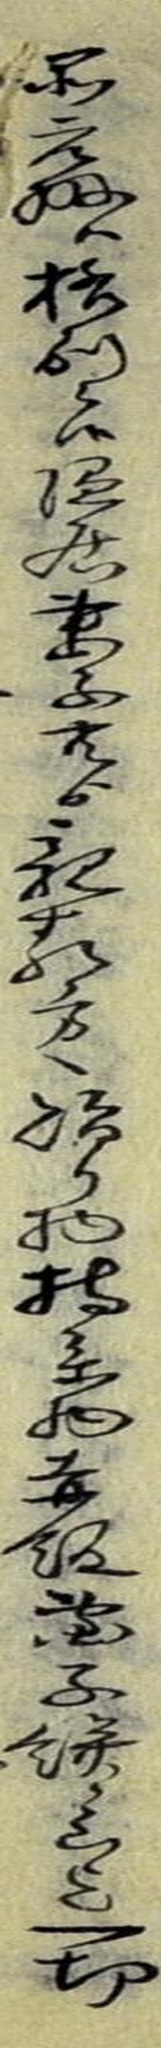品取扱ハ格別ニ候隠居妻子共ゟ親類方へ贈り物持参物赤飯団子餅ニ至迄一切
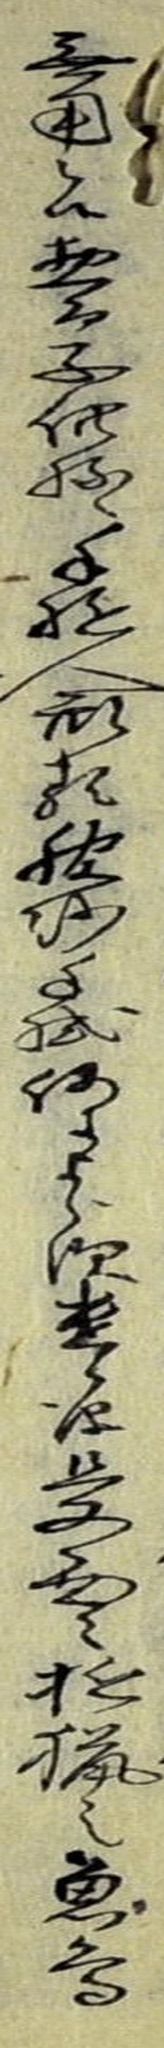無用ニ候惣而子供抔へ手遊人形類服紗手拭何によらす遣候儀且又面々遊猟之魚鳥
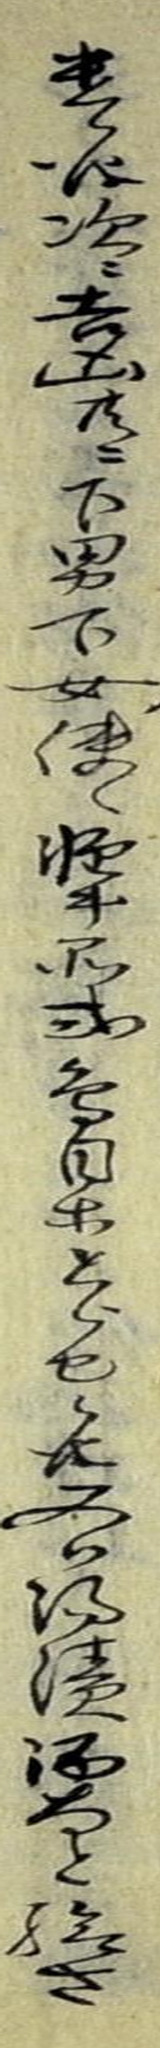遣候儀次ニ吉凶共ニ下男下女使候軽キ品或鳥目等とらせ候儀又ハ湯漬酒なと給さ
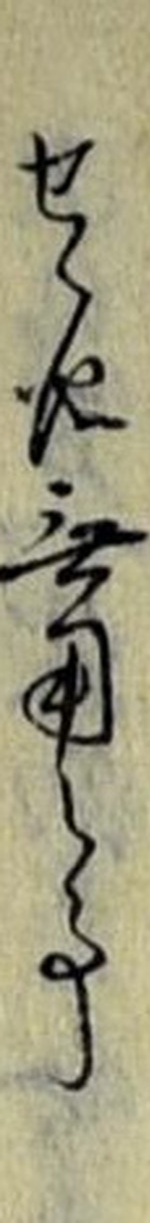せ候儀無用之事
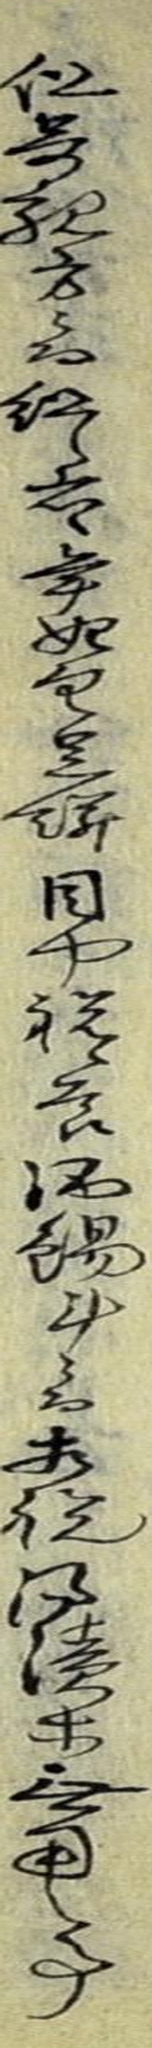但寄親方ニ而組之者へ年始具足餅目中祝候節酒鯣斗ニ而相祝湯漬等無用之事
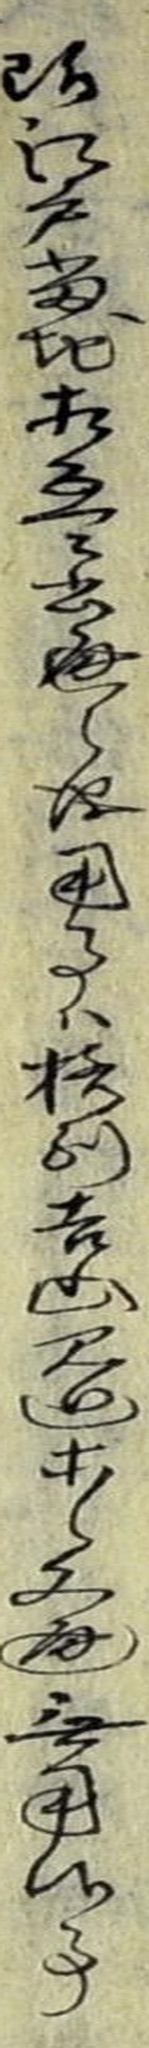附江戸当地相互ニ書通之儀用事ハ格別吉凶見廻等之文通無用候事
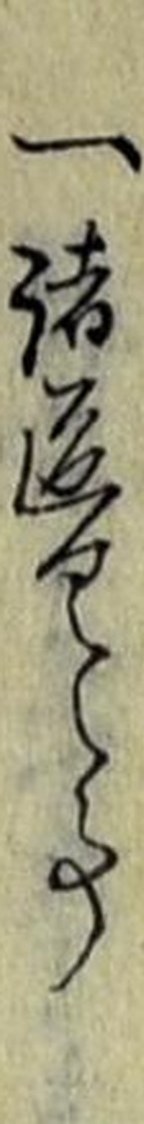一諸道具之事
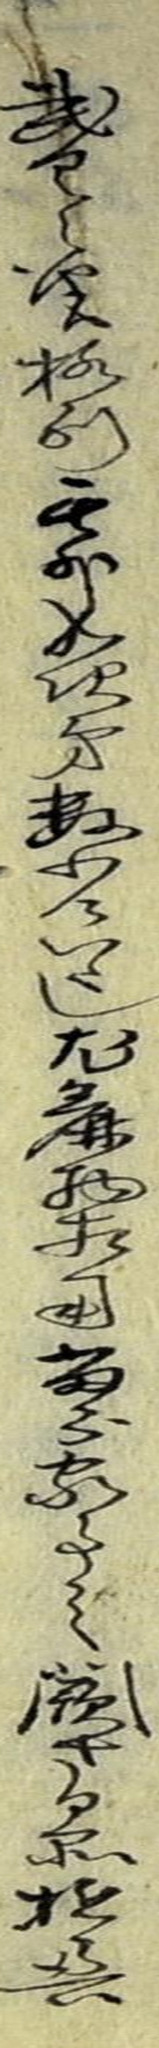武具之儀ハ格別其外成次第数少ニいたし尤麁物相用当分家事之闕さる品遊興
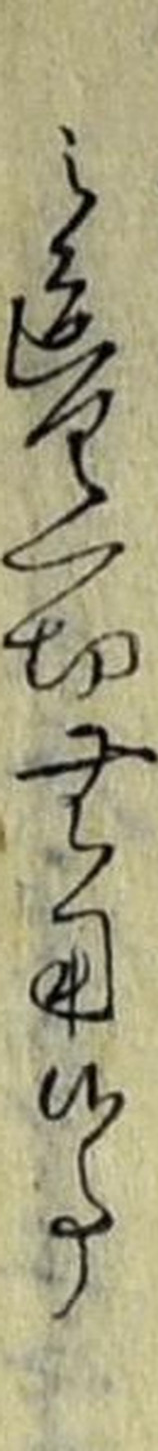之道具一切無用候事
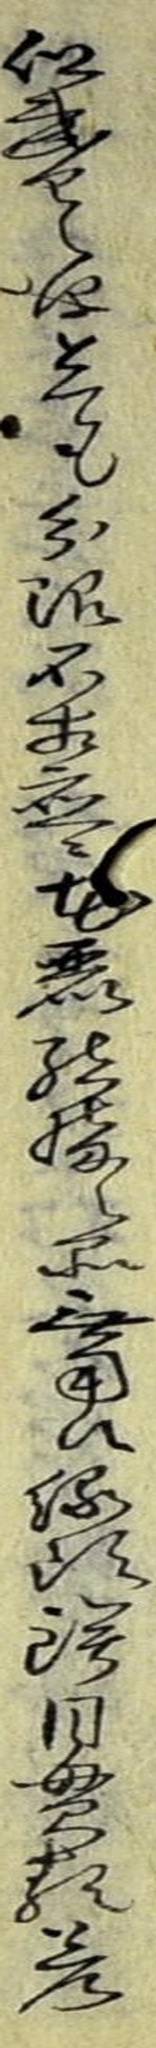但武具之儀とても分限不相応ニ花麗結構之品無用候縁頭鍔目貫類差
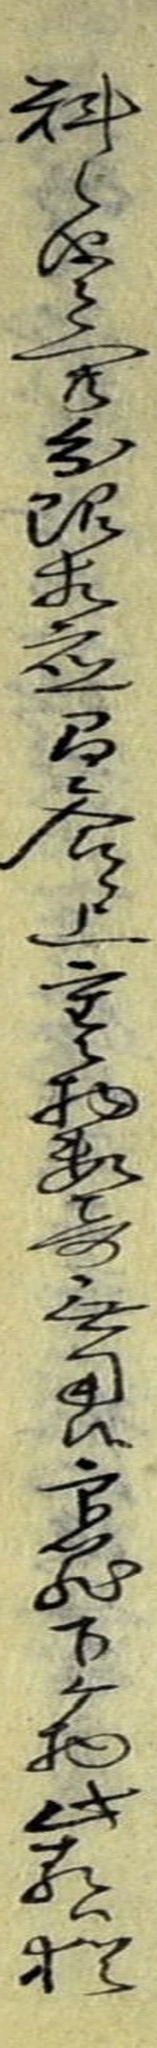料之儀ニ候へ共分限相応間ニ合候上重々物数奇無用候印籠下ケ物此類ハ猶
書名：命令之部 一
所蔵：福井県文書館 Fukui Prefectural Archives
